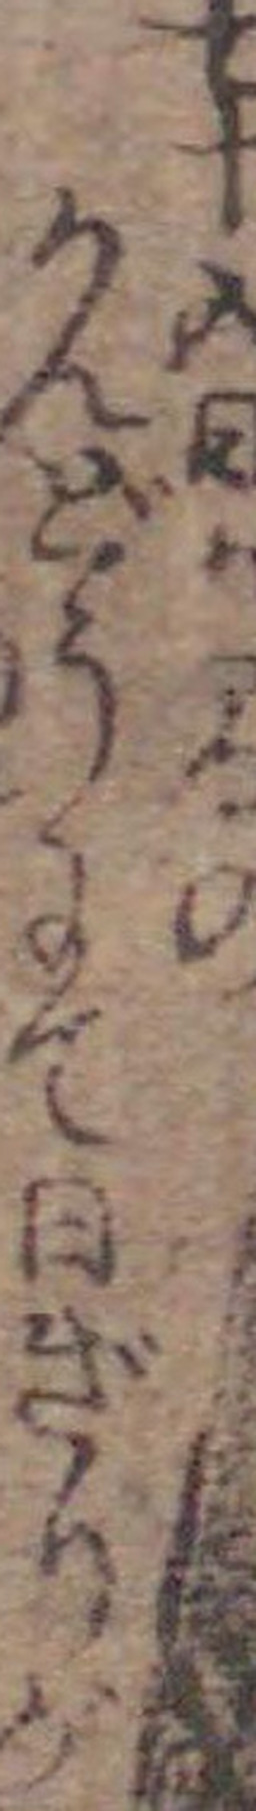かんどうにて日ぎりが

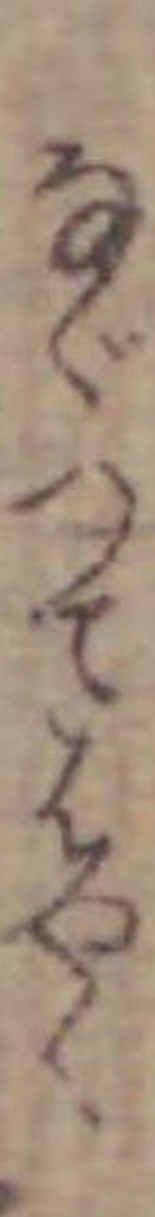なぐつてはやく
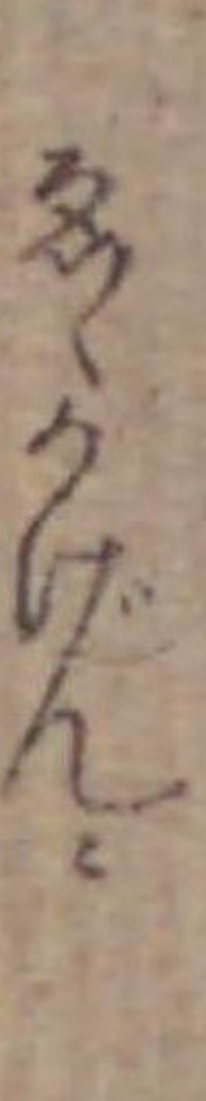ゑゝかげんに
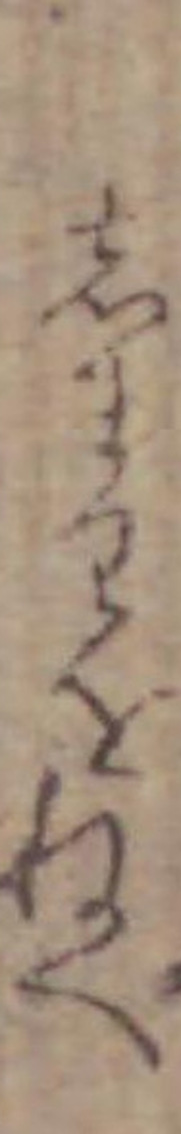しまわをねへ
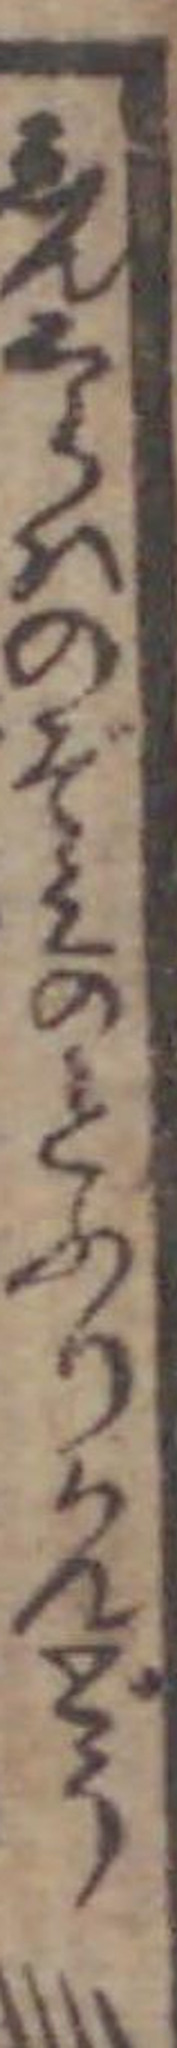ゑん二郎はのぞみのとふりかんどう
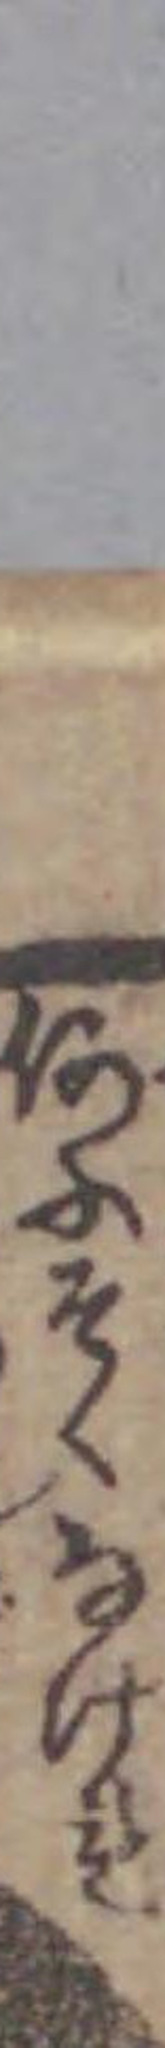何ふそくなけれ
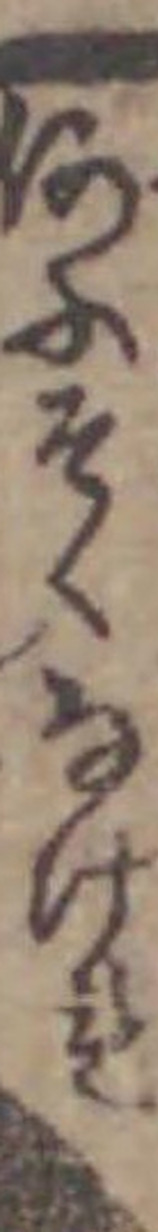何ふそくなけれ
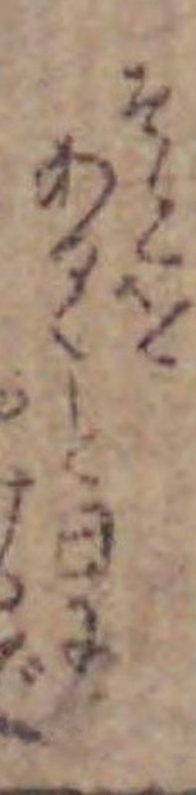あるくと日に
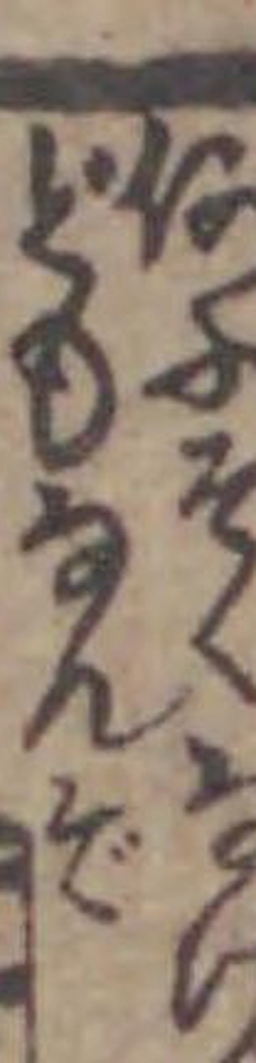どもなんぞ
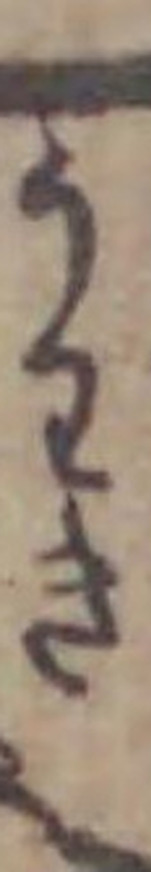うわき
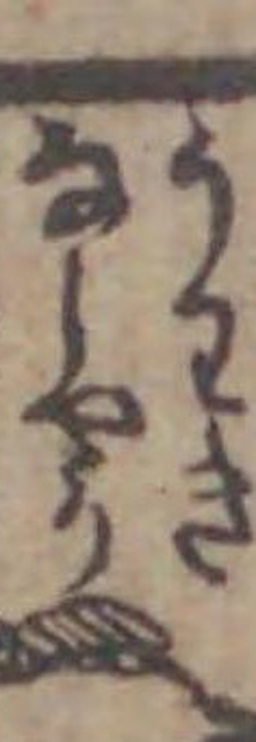なしやう
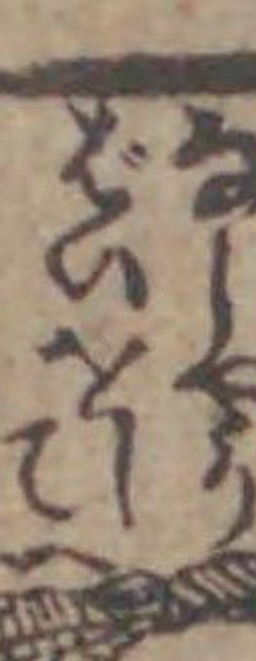ばいをして
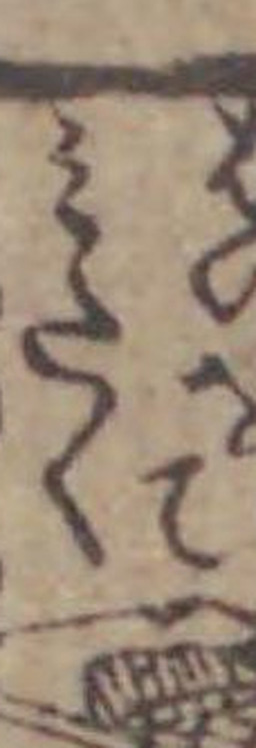みたく
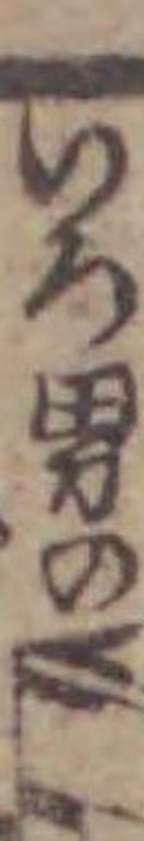いろ男の
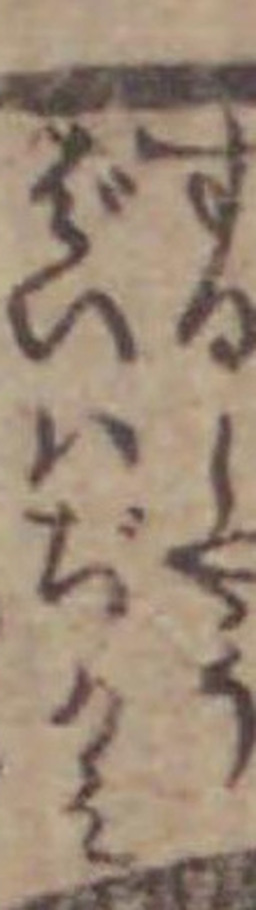ばいはぢかみ
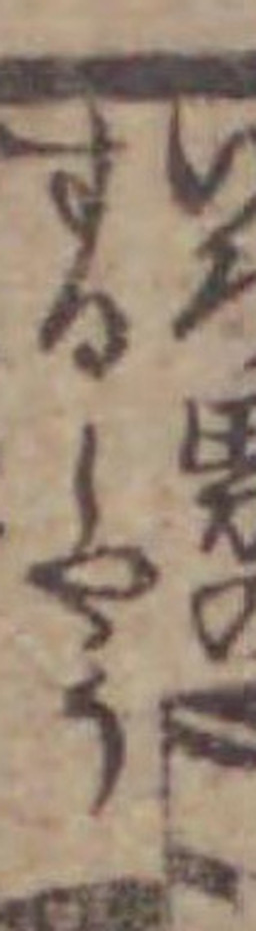するしやう
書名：江戸生艶気樺焼 : 3巻
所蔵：国立国会図書館 National Diet Library, JAPAN
